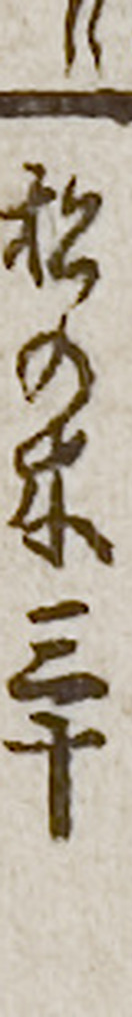松の木三十
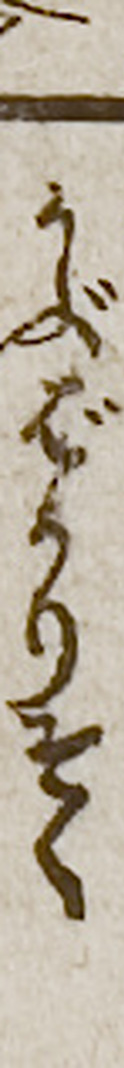かぶばかりそく
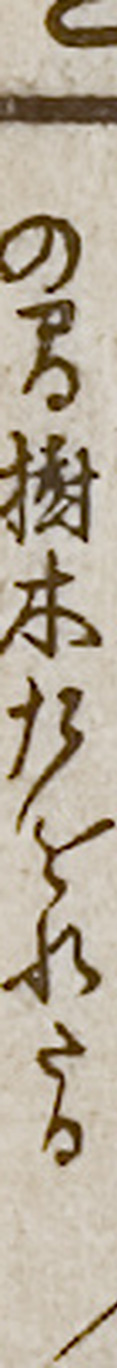の間樹木たをれたる
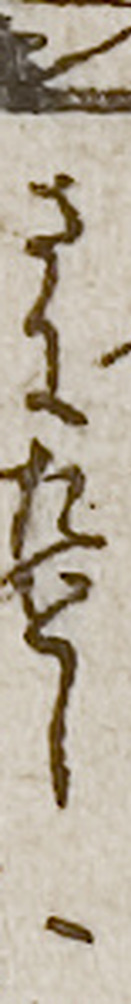さにたをし
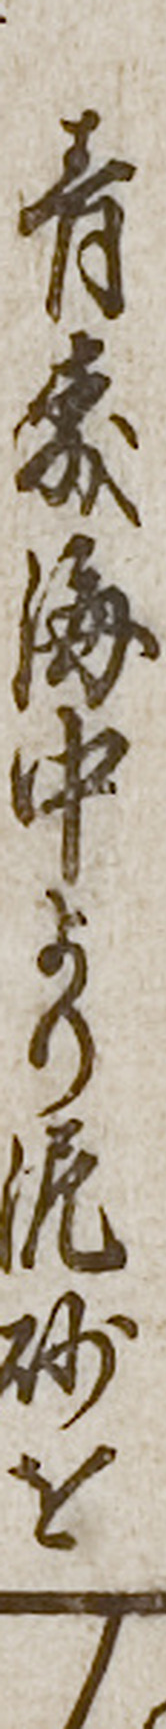青森海中より泥砂を
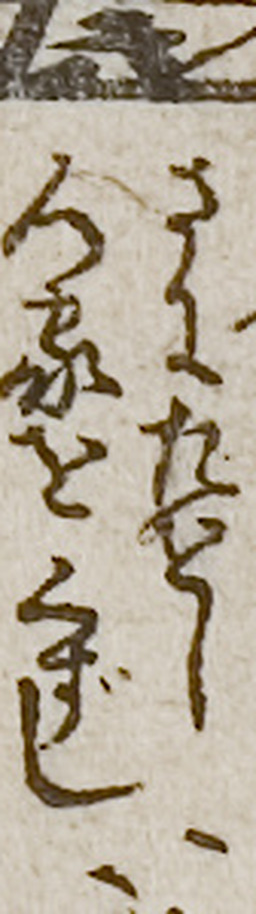人家をくずし
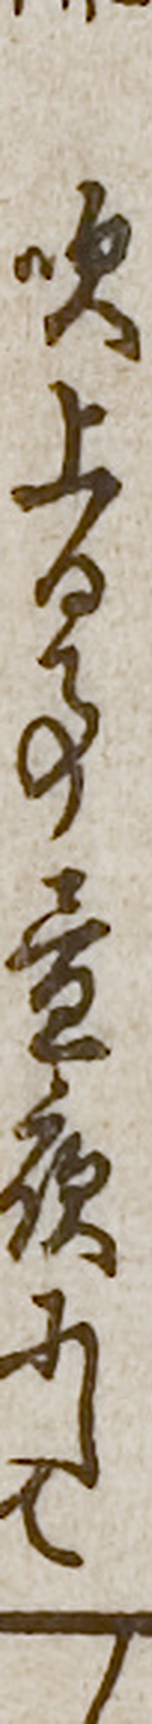吹上る事昼夜にして
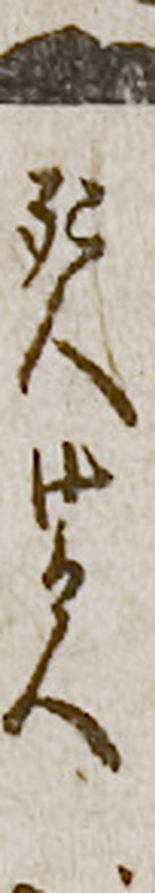死人けが人
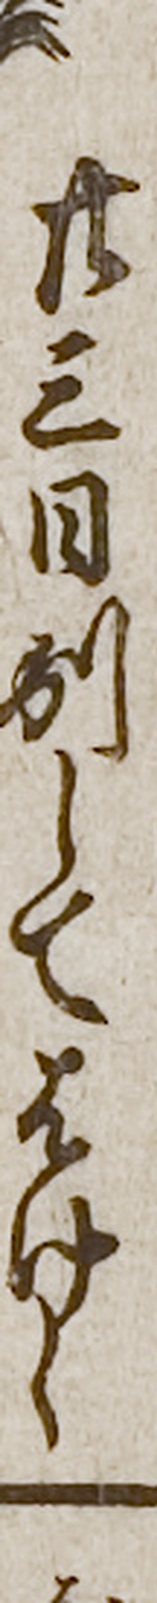廿三日別してはけし
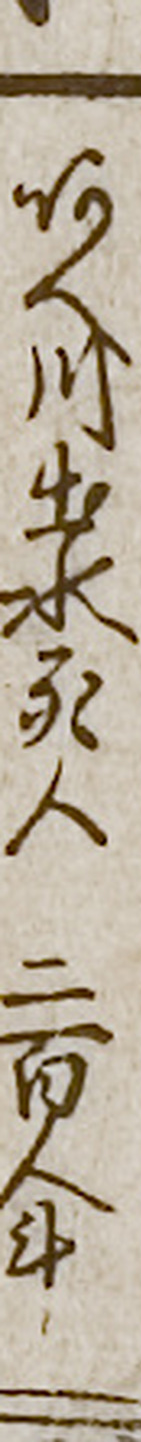あへ川出水死人二百人斗
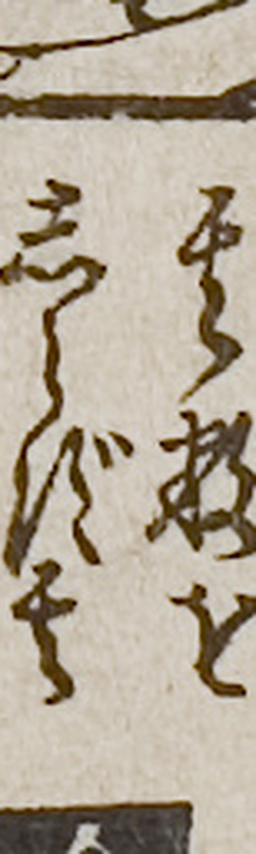しらず其
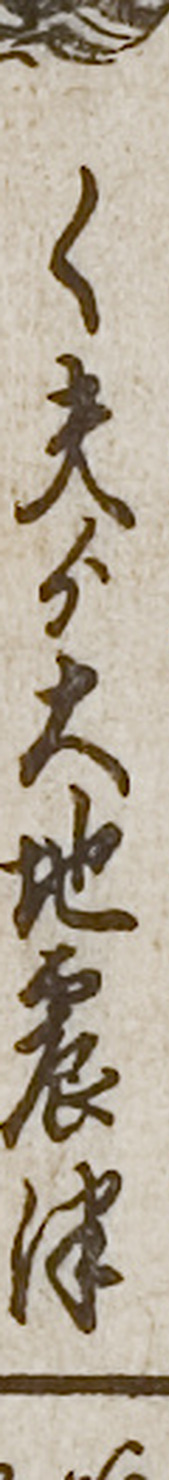く夫より大地震津
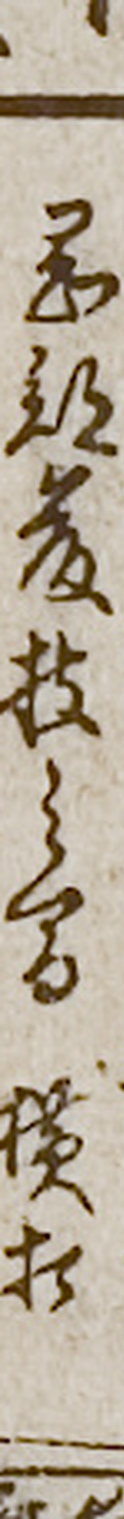岡部藤枝之間横打
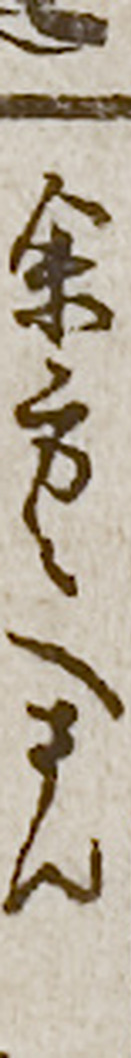余方々へさん
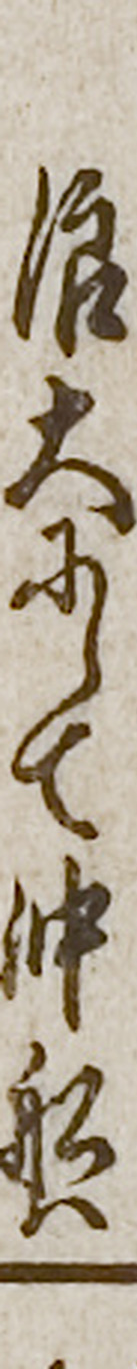浪大にして沖船は
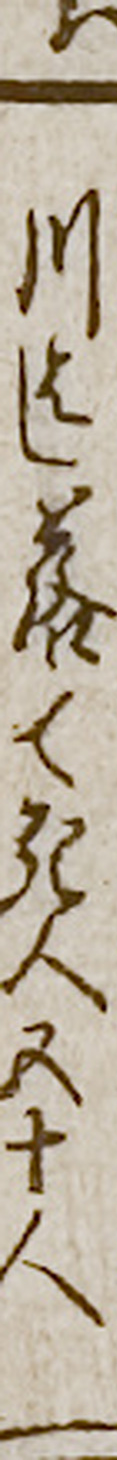川はし落て死人五十人
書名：江戸東海道東国荒珍事図
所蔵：東京大学総合図書館 General Library in the University of Tokyo, JAPAN
